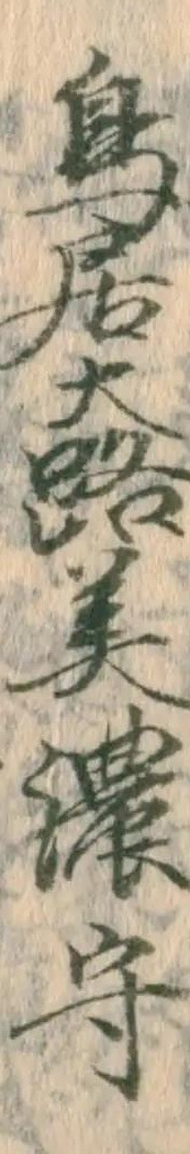鳥居大路美濃守
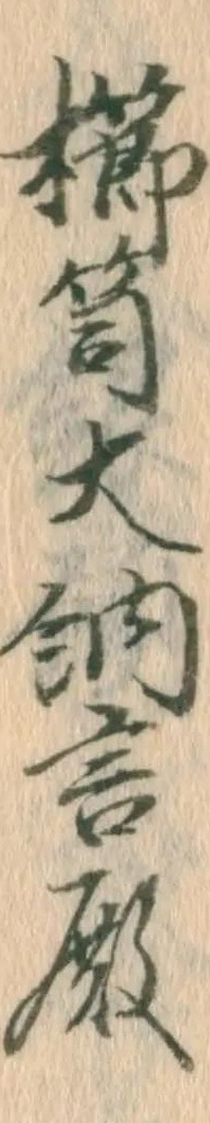櫛笥大納言殿
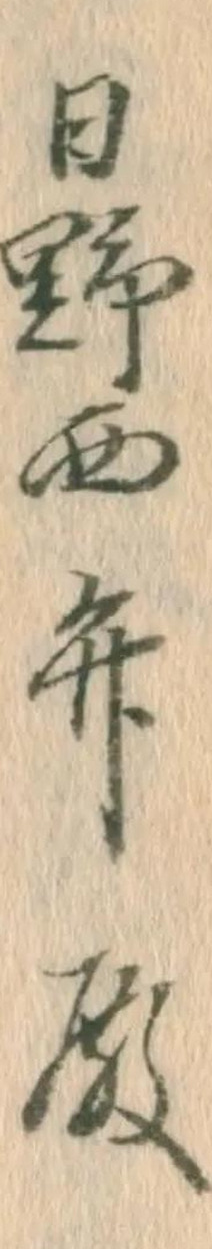日野西弁殿
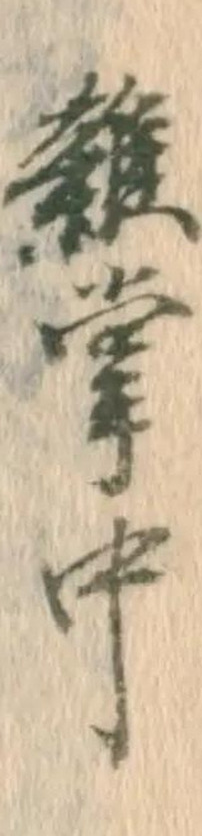雑掌中
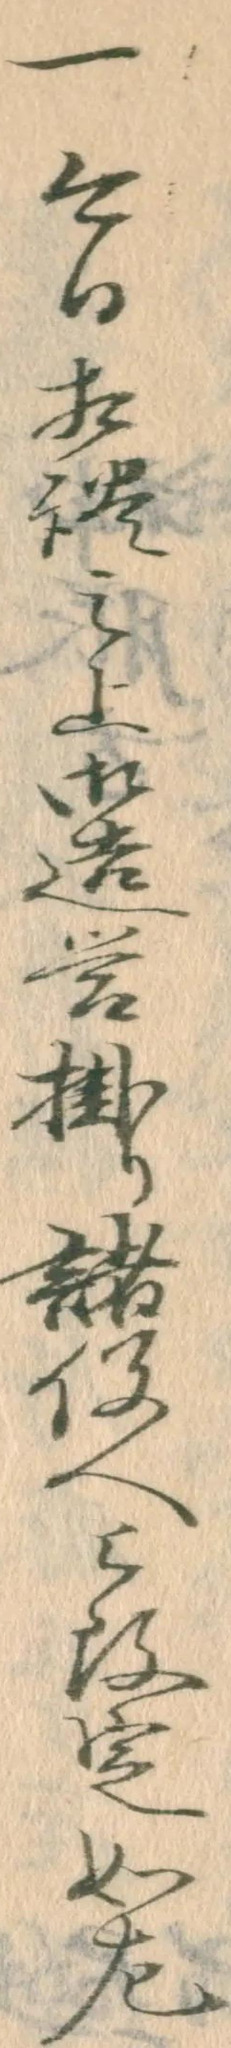一今日相談之上御造営掛り諸役人被改定如左
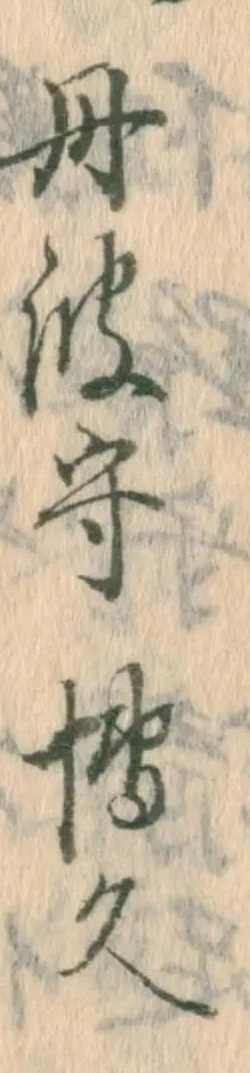丹波守博久
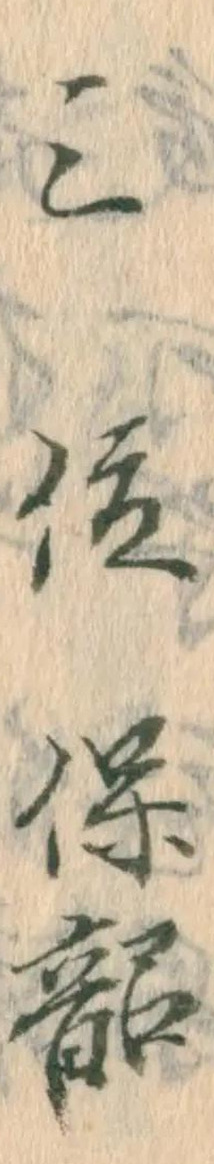三位保韶
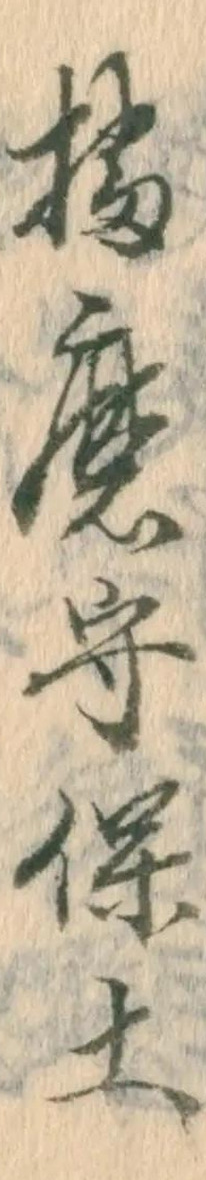播磨守保土
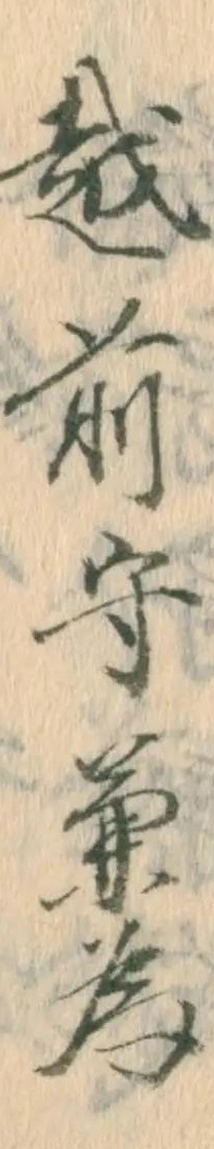越前守兼為
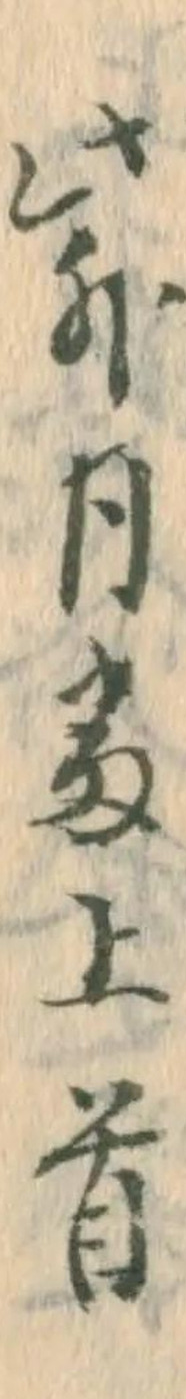此外月番上首

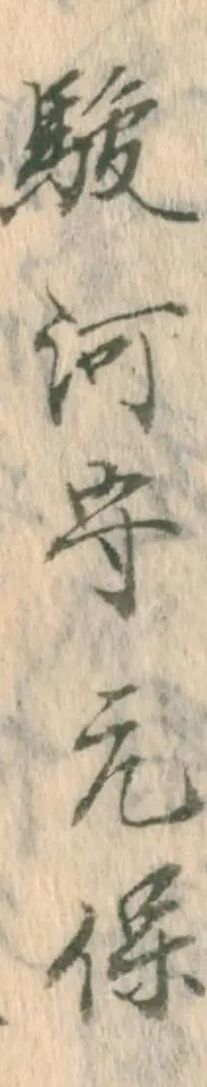駿河守元保
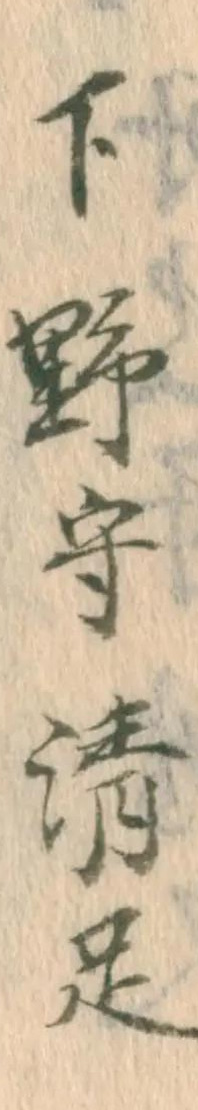下野守清足
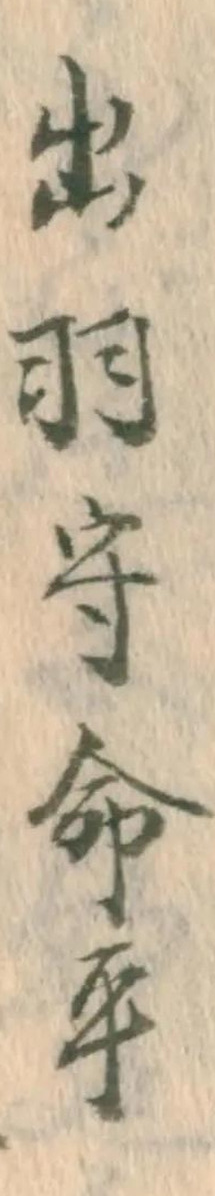出羽守命平
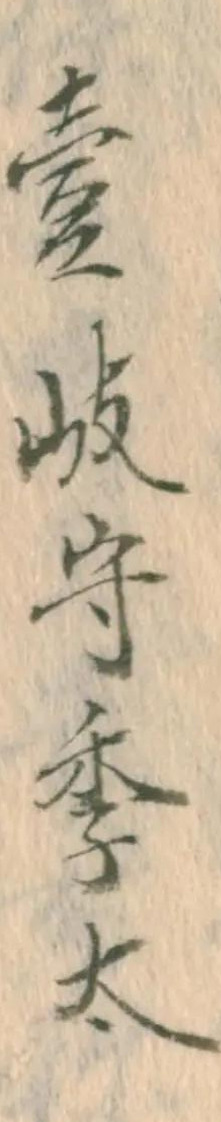壱岐守季太
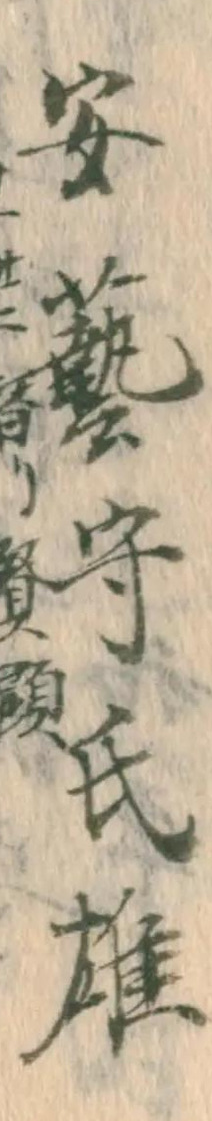安芸守氏雄
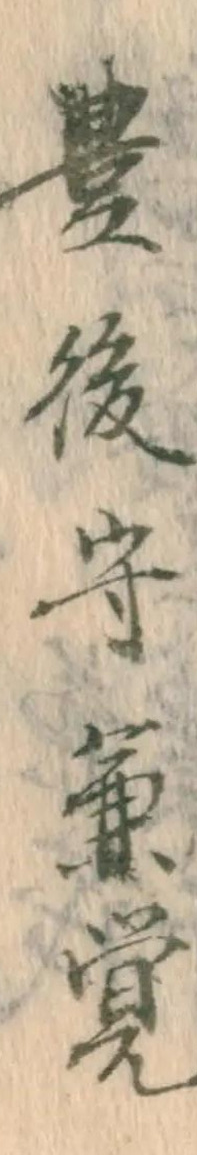豊後守兼覚
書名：賀茂社記録. 第17冊
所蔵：国立国会図書館 National Diet Library, JAPAN
